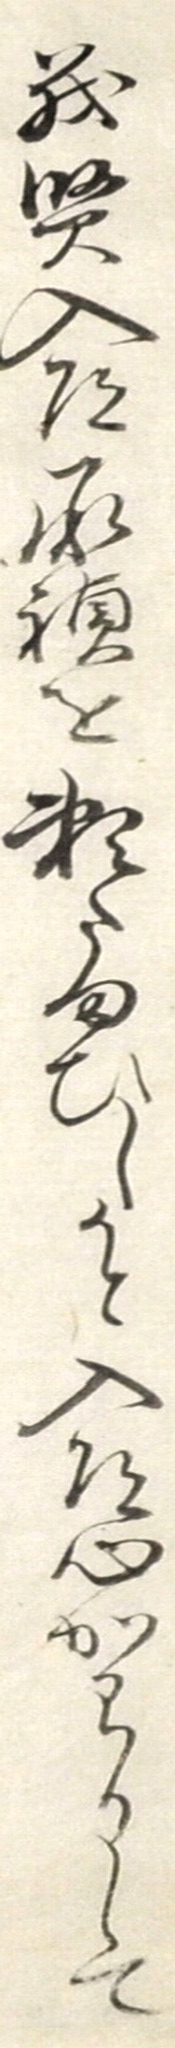義賢入道承禎を頼たまひしかと入道心かわりして
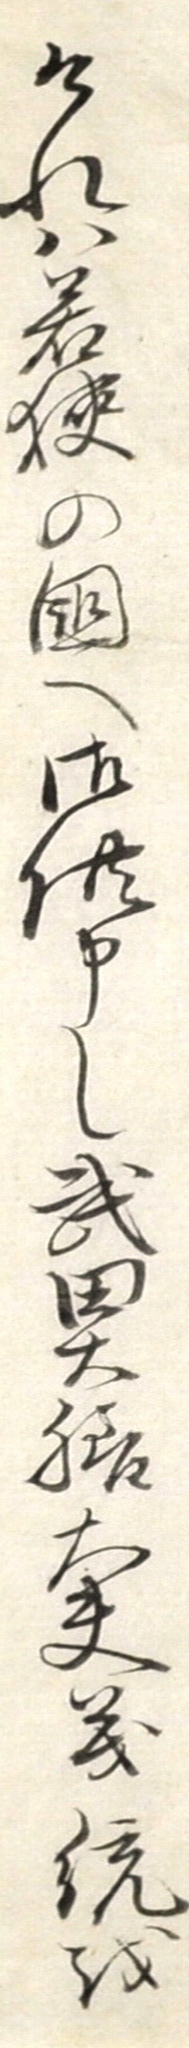けれは若狭の国へ御供申し武田大膳大夫義統を
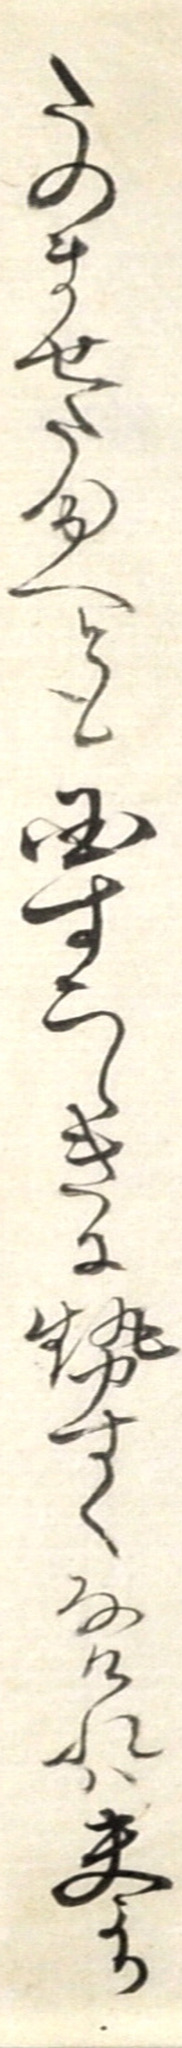たのませたまへとも国すこしきに勢すくなけれは夫より
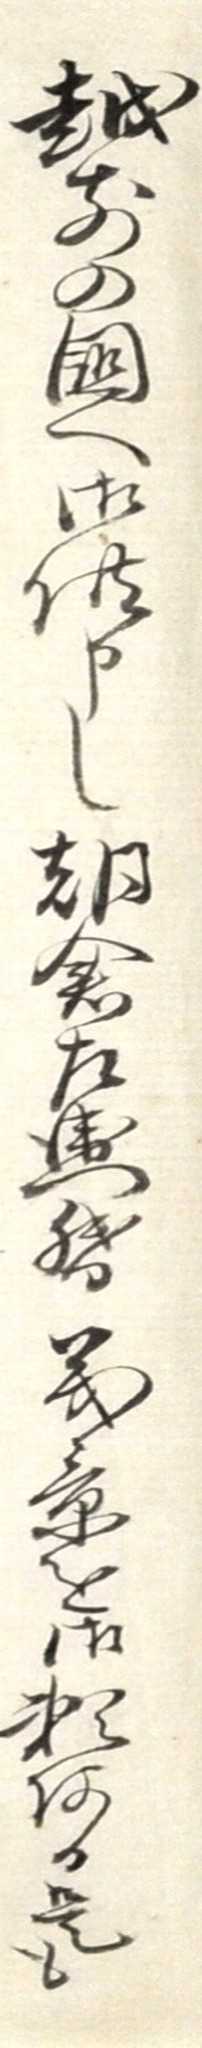越前の国へ御供申し朝倉左衛門督義景を御頼ある是も
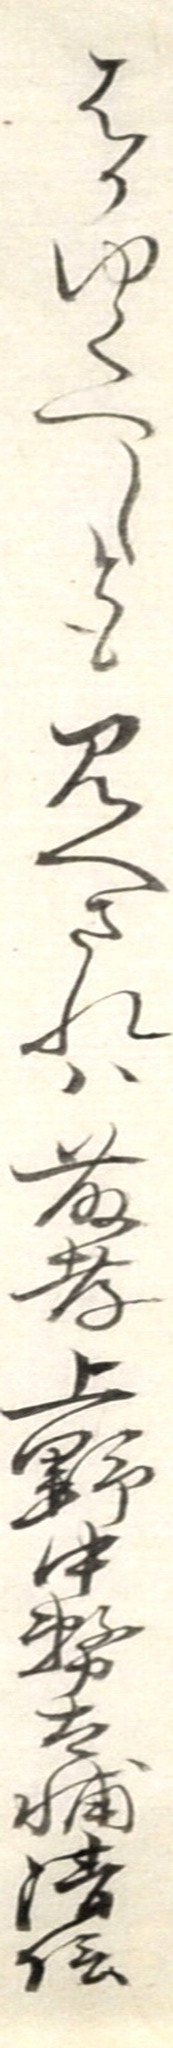はかゆくへしとも見へされは藤孝上野中務太輔清信
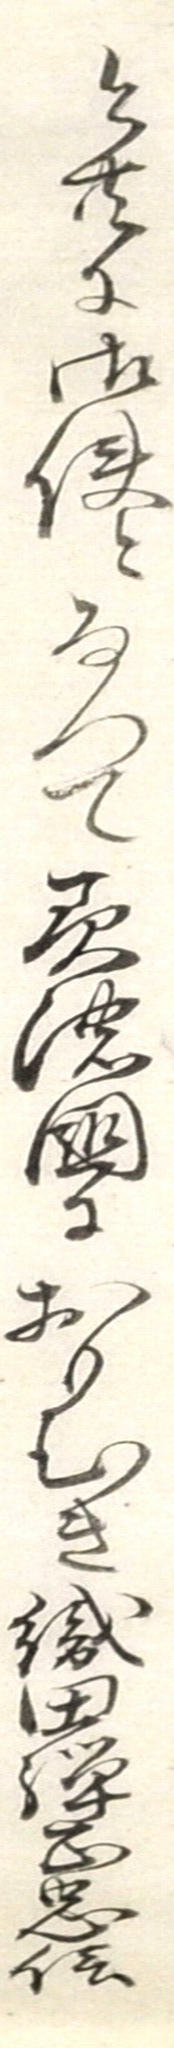と共に御使となつて美濃国におもむき織田弾正忠信
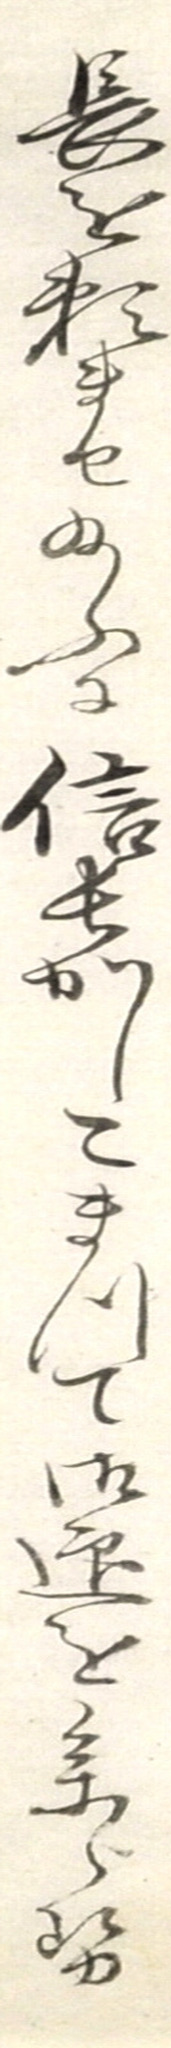長を頼ませ給ふに信長かしこまつて御迎を参らせ
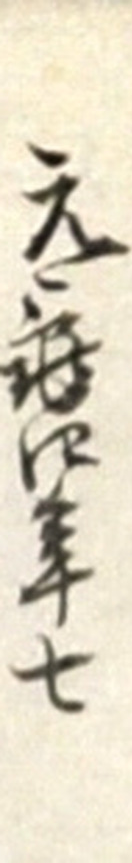元亀四年七
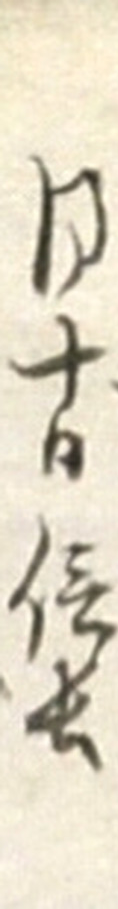月十日信長
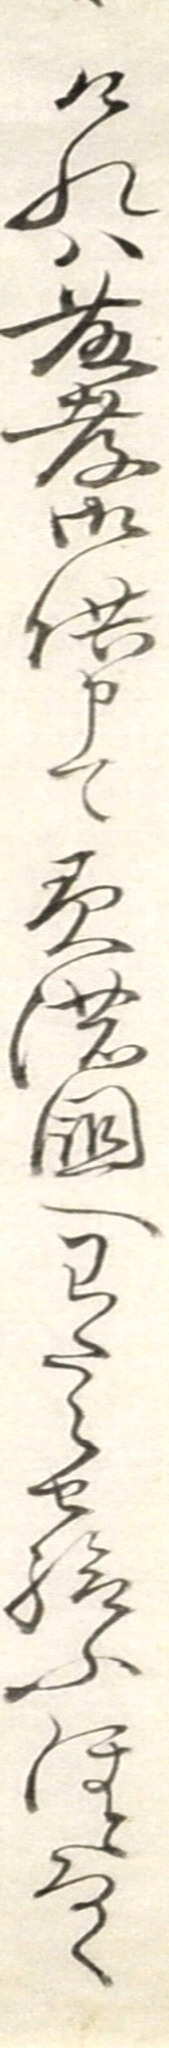けれは藤孝御供申て美濃国へわたらせ給ふほとなく
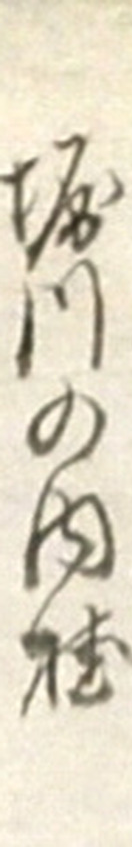堀川の内桂
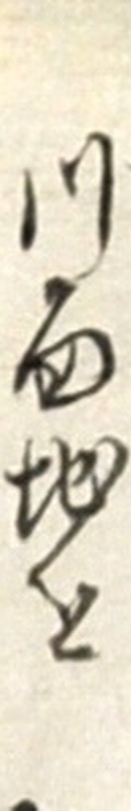川西地を
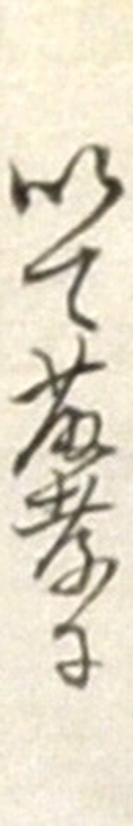以て藤孝に
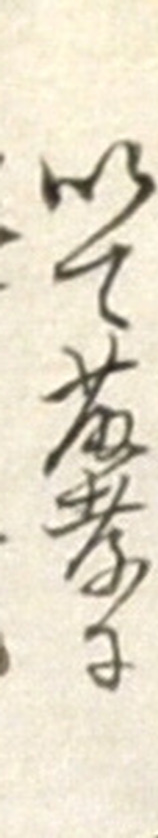以て藤孝に
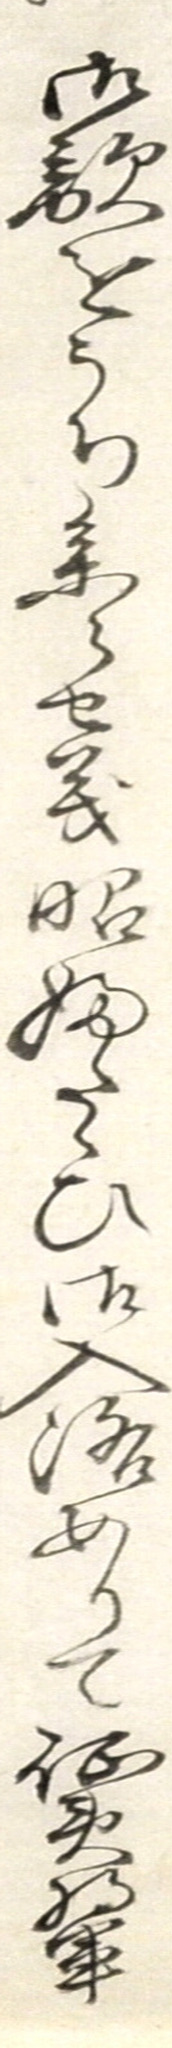御敵をうち参らせ義昭ふたゝひ御入洛ありて征夷将軍
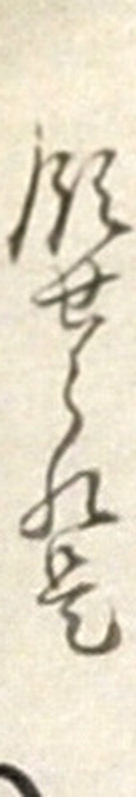領せられ是
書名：藩翰譜（七・下）
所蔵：伊那市立高遠町図書館・合同会社AMANE
